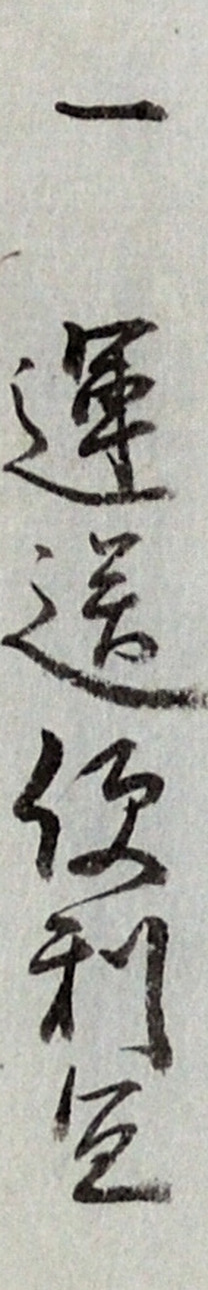一運送便利宜

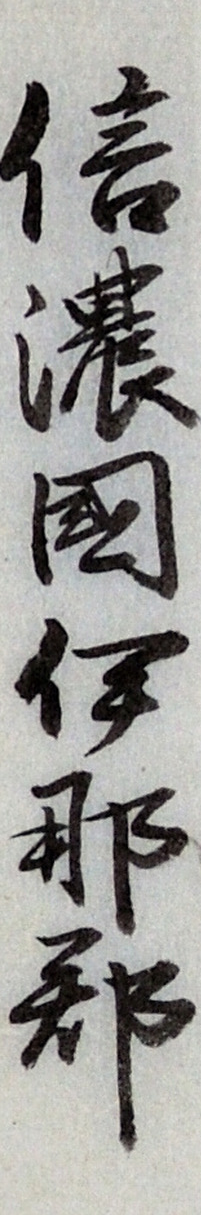信濃国伊那郡
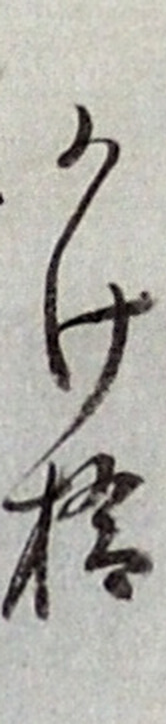かけ橋
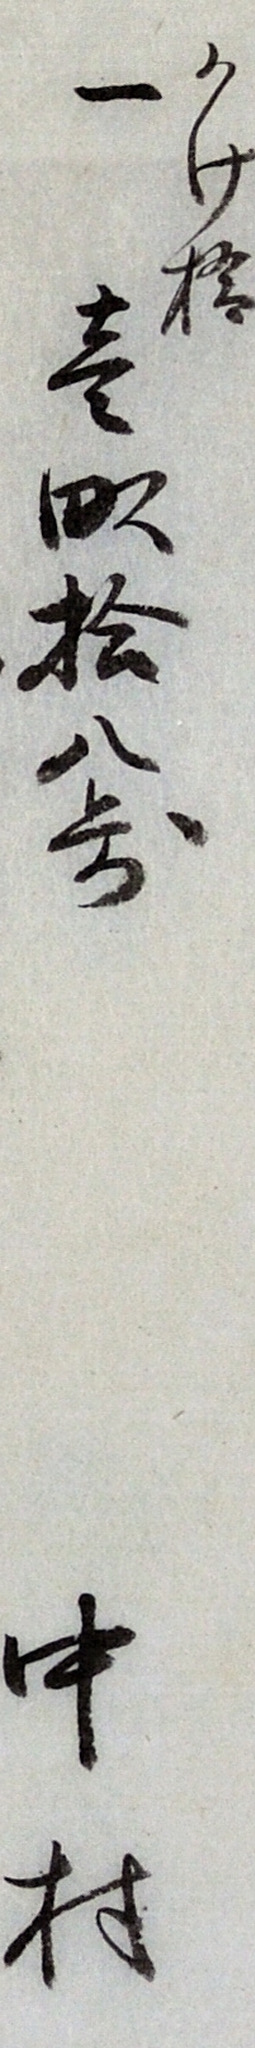一壱㽗拾八歩中村
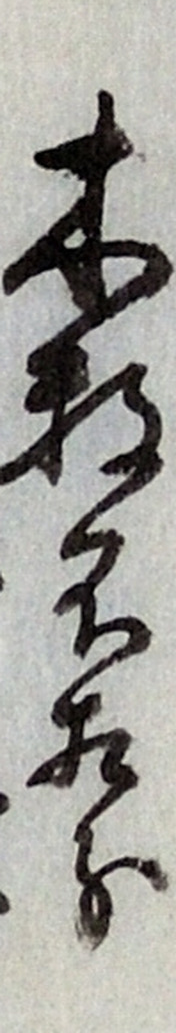木数不相分
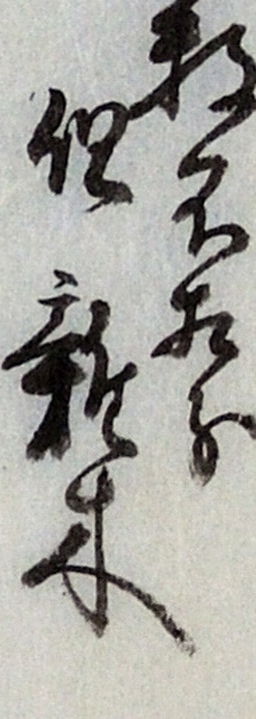但雑木
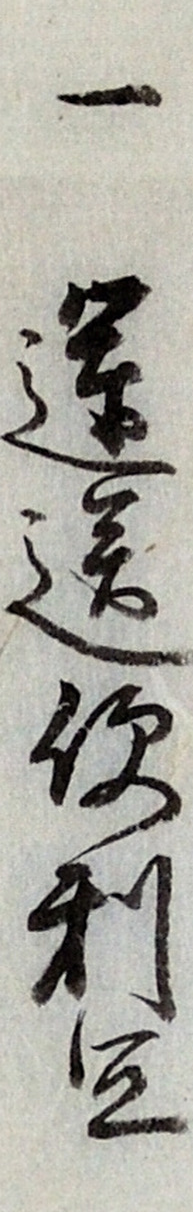一運送便利宜
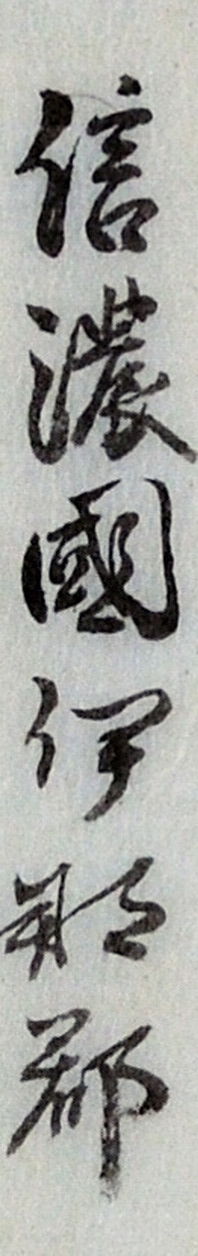信濃国伊那郡
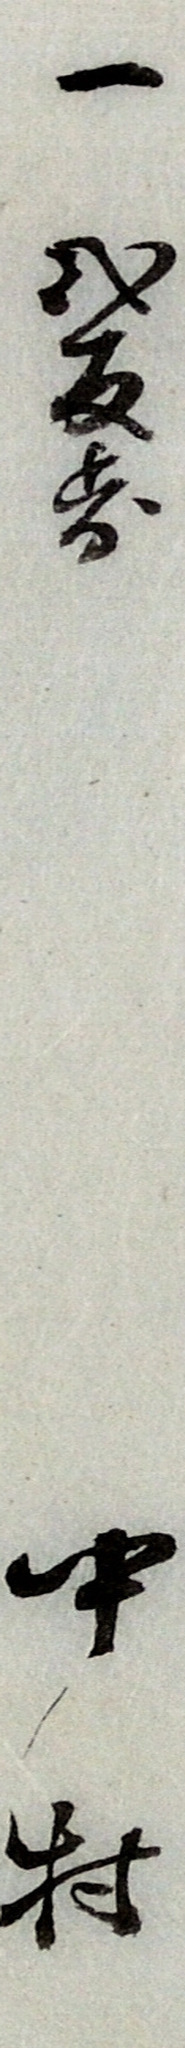一弐反歩中村
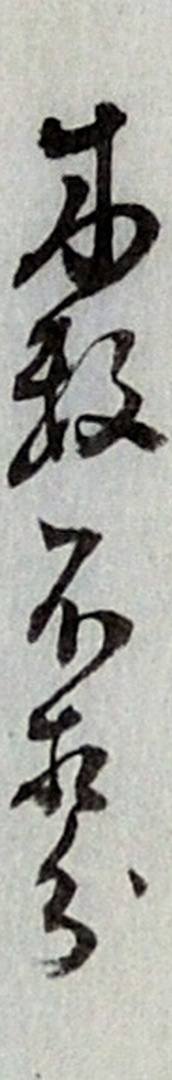木数不相分
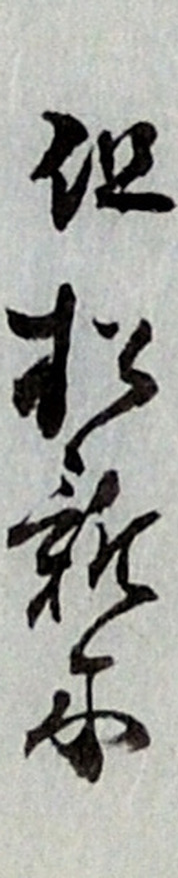但松雑木
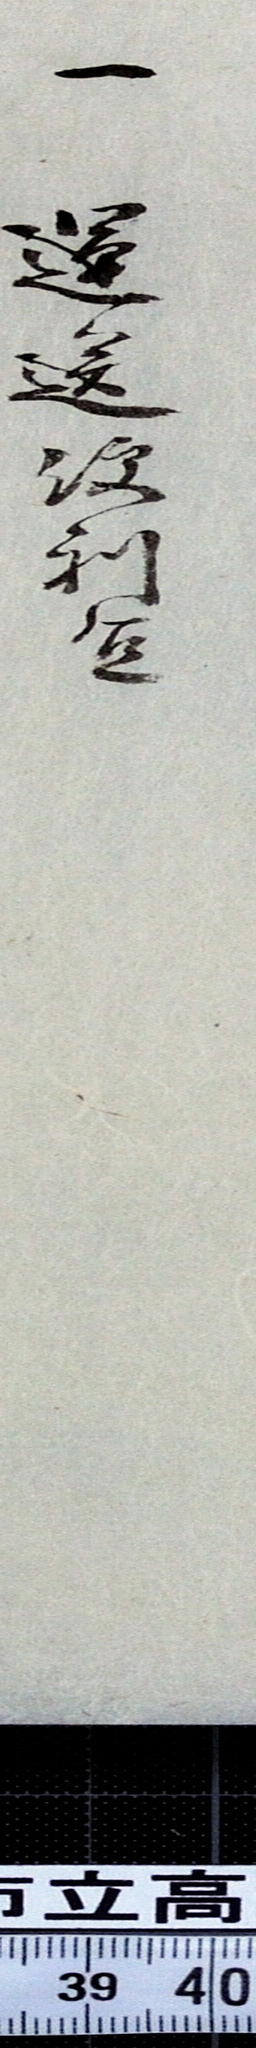一運送便利宜
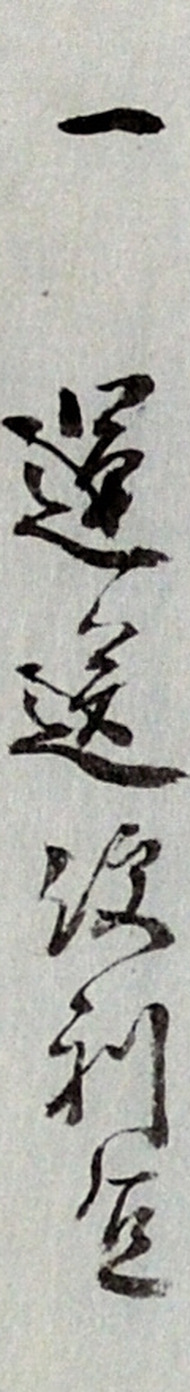一運送便利宜
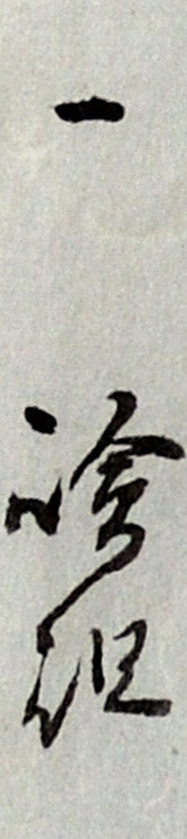一嶮岨

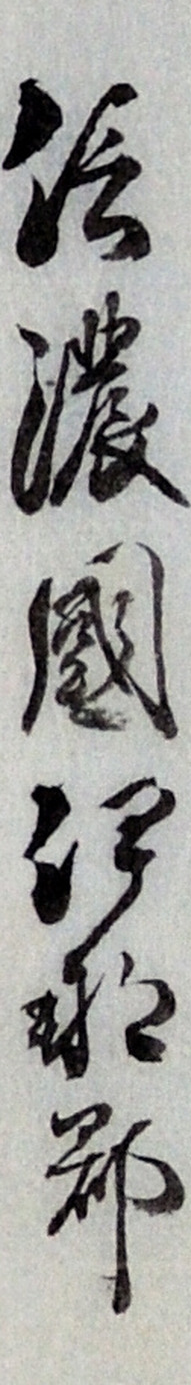信濃国伊那郡
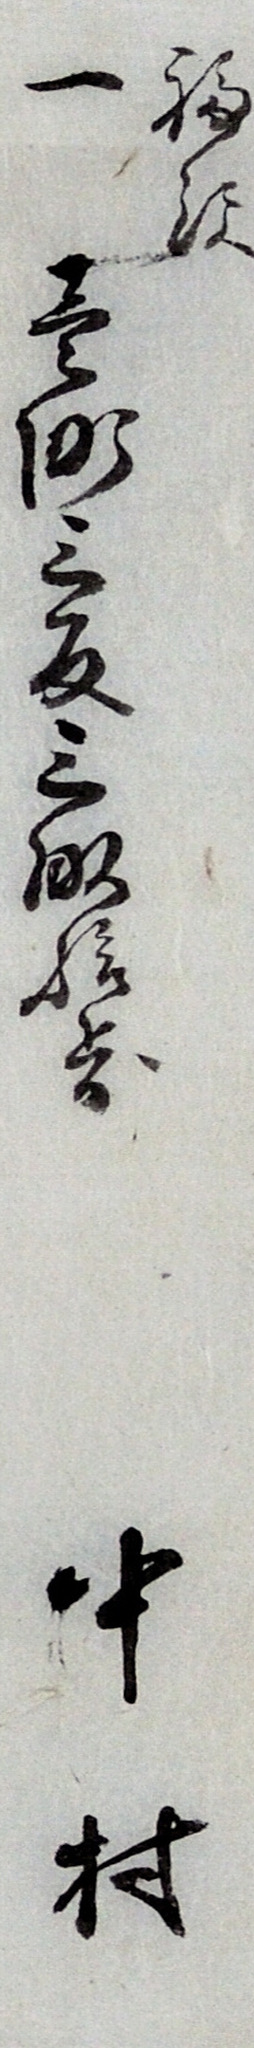一壱町三反三㽗拾歩中村
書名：官林反別帳
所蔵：伊那市立高遠町図書館・合同会社AMANE
